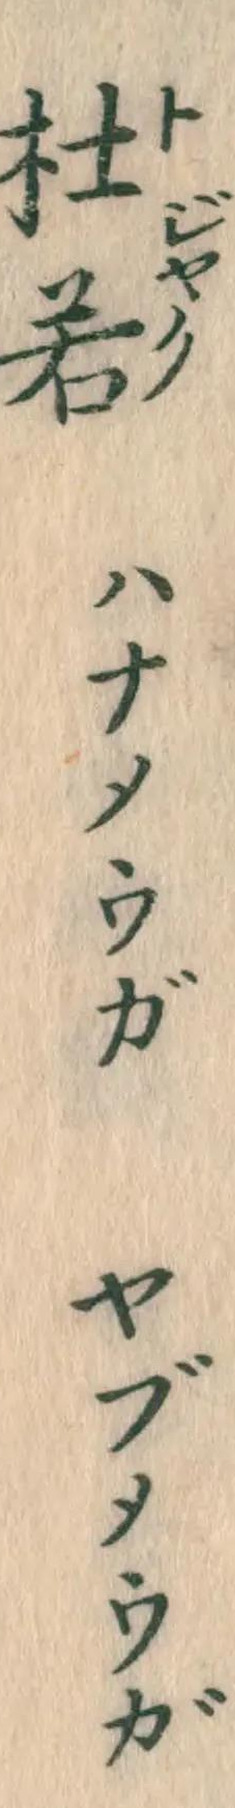杜若ハナメウガヤブメウガ
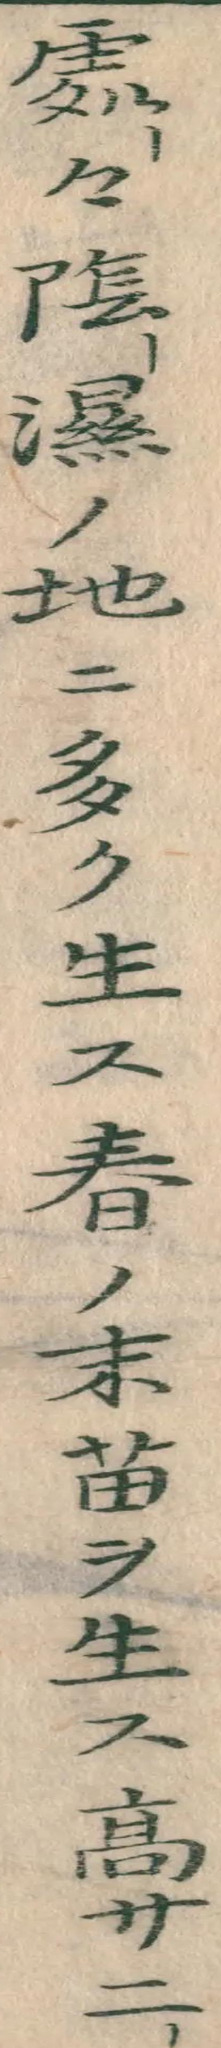処-々陰-湿ノ地ニ多ク生ス春ノ末苗ヲ生ス高サ二-
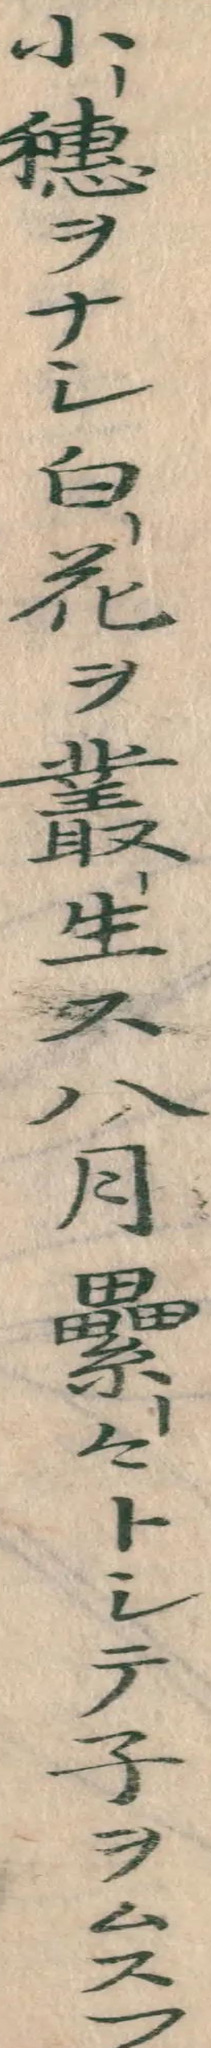小-穂ヲナシ白-花ヲ叢-生ス八月纍-々トシテ子ヲムスフ
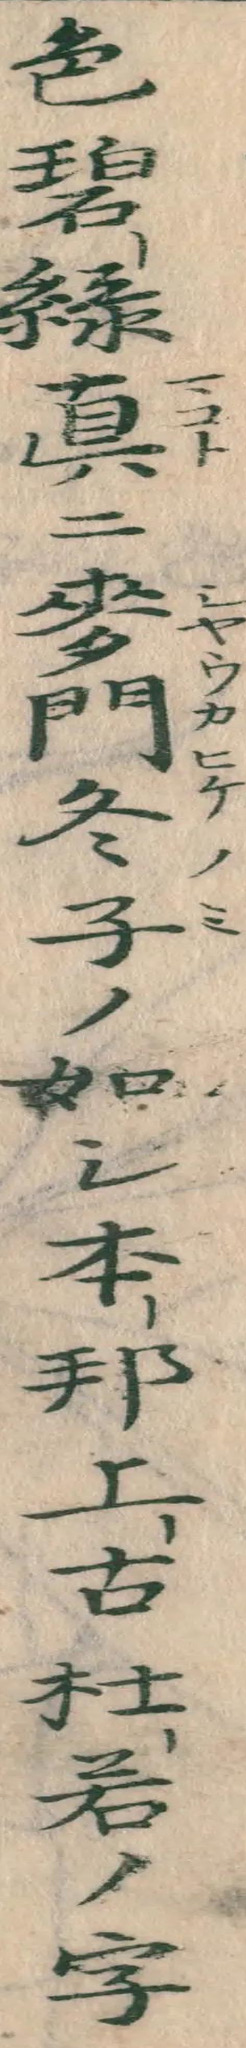色碧-緑真ニ麦門冬子ノ如シ本-邦上-古杜-若ノ字

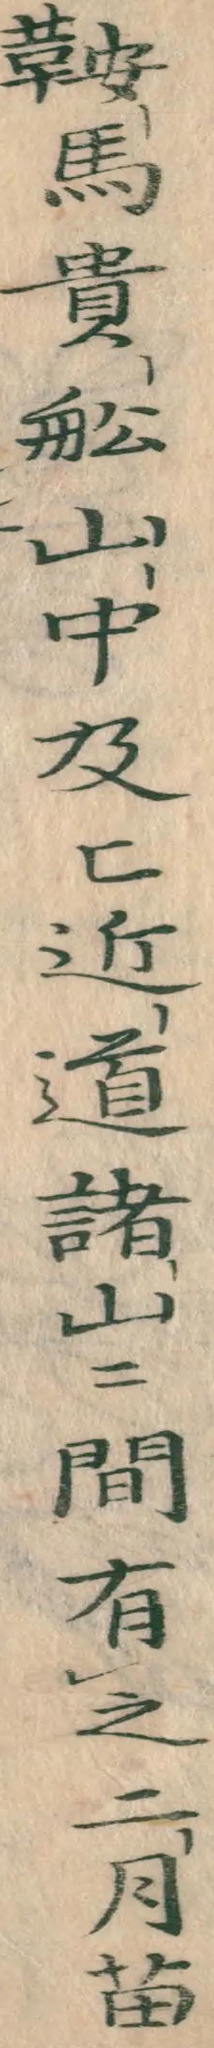鞍-馬貴-船山-中及ヒ近-道諸-山ニ間有之二-月苗
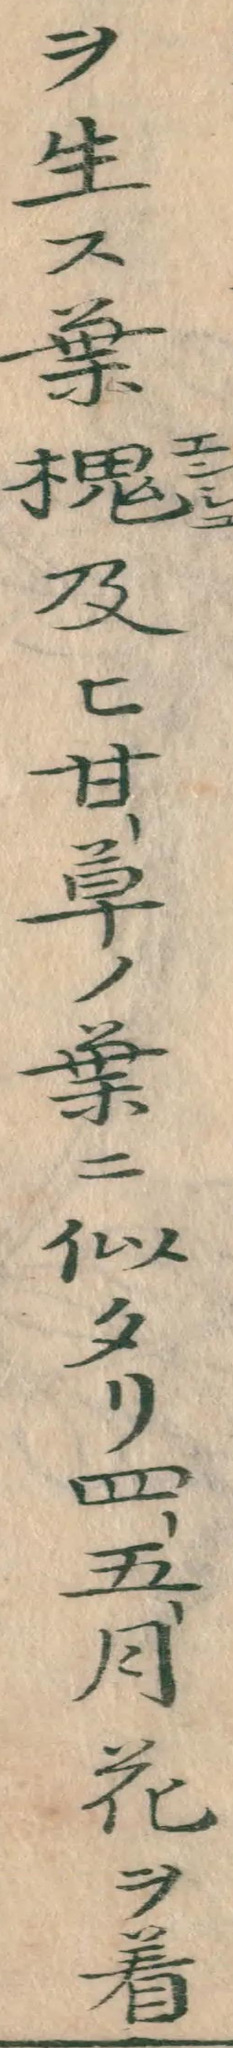ヲ生ス葉槐及ヒ甘-草ノ葉ニ似タリ四-五-月花ヲ着
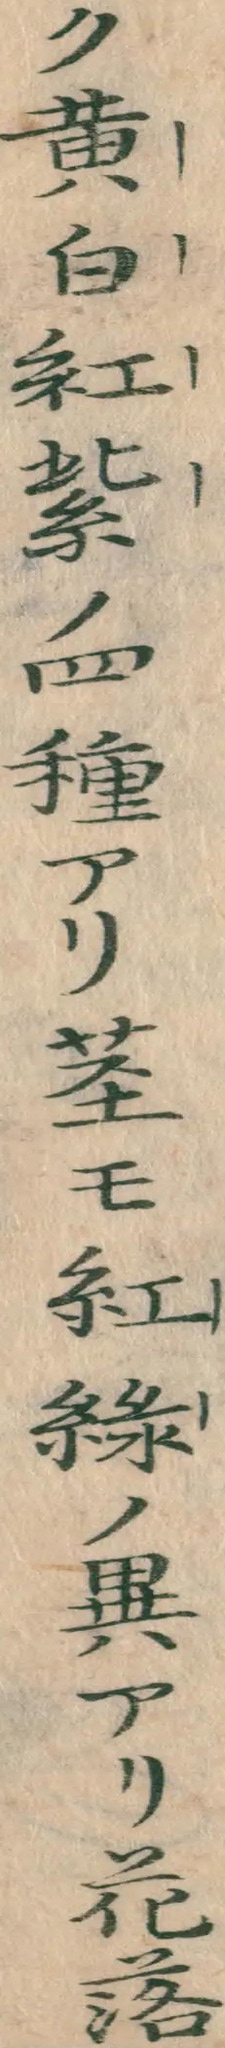ク黄白紅紫ノ四種アリ茎モ紅緑ノ異アリ花落
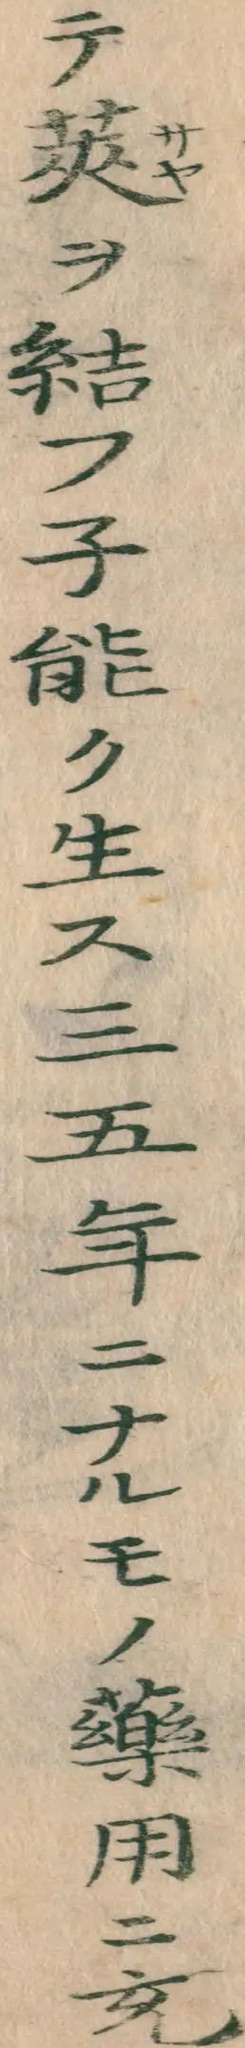テ莢ヲ結フ子能ク生ス三五年ニナルモノ薬用ニ充
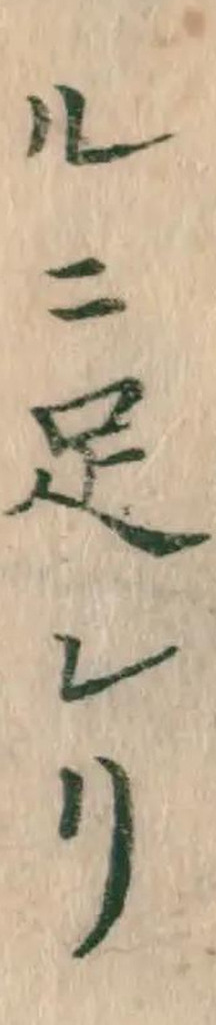ルニ足レリ
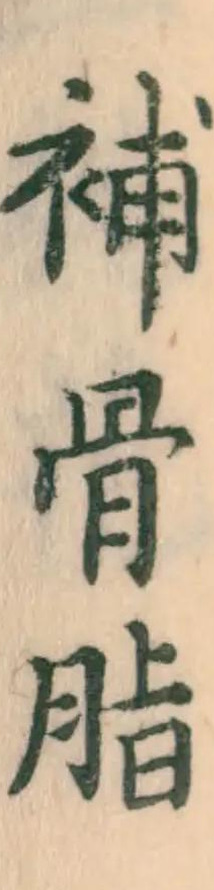補骨脂

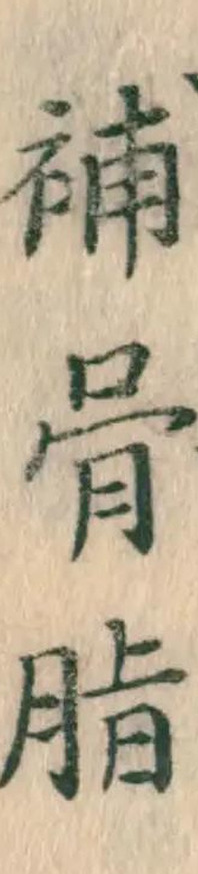補骨脂
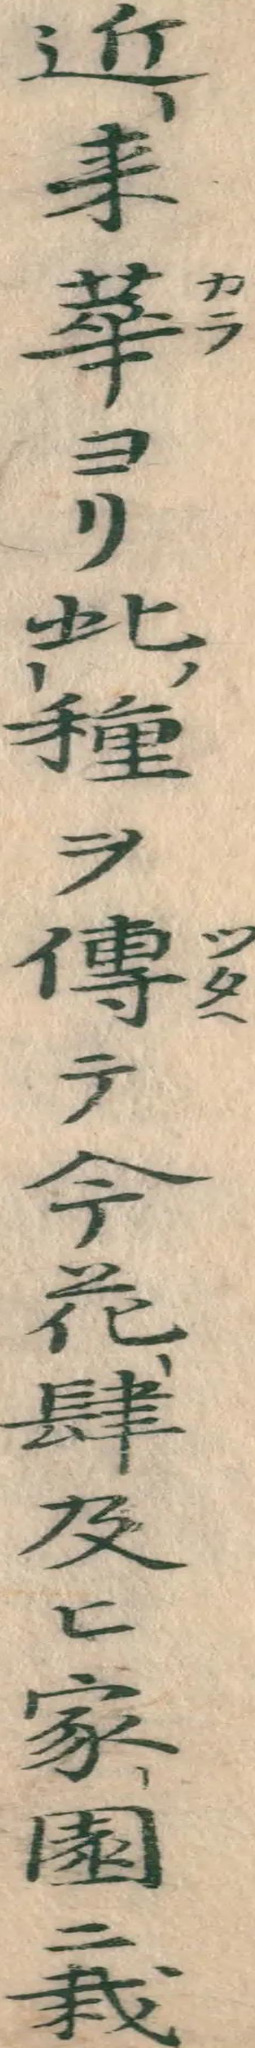近-来華ヨリ此-種ヲ伝テ今花-肆及ヒ家-園ニ栽
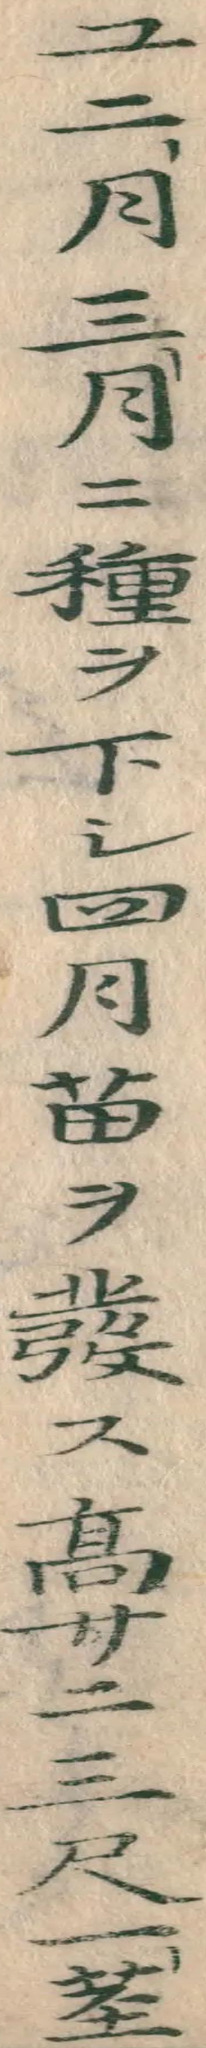ユ二-月三-月ニ種ヲ下シ四月苗ヲ発ス高サ二三尺一-茎
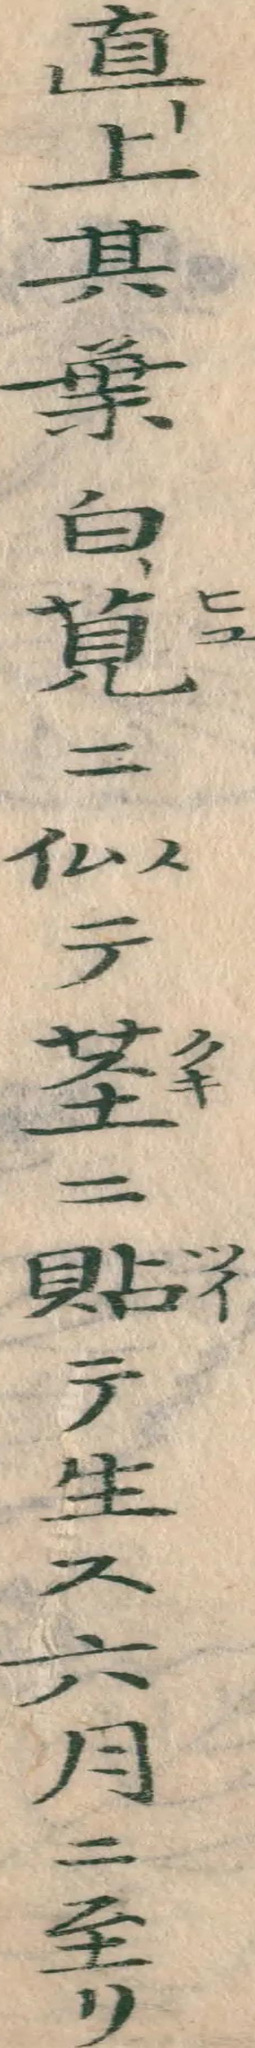直-上其葉白-莧ニ似テ茎ニ貼テ生ス六月ニ至リ
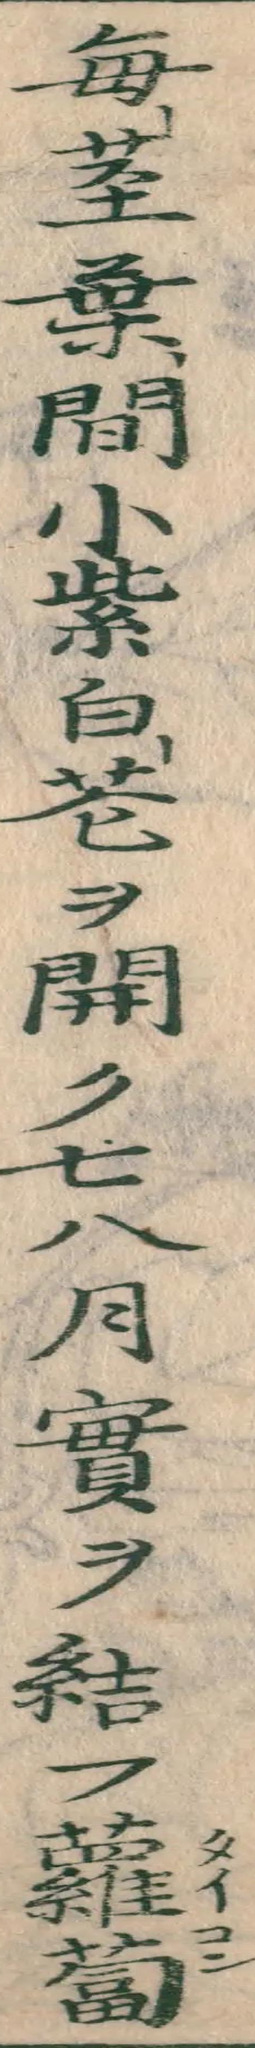毎-茎葉-間小紫白-花ヲ開ク七八月実ヲ結フ蘿蔔
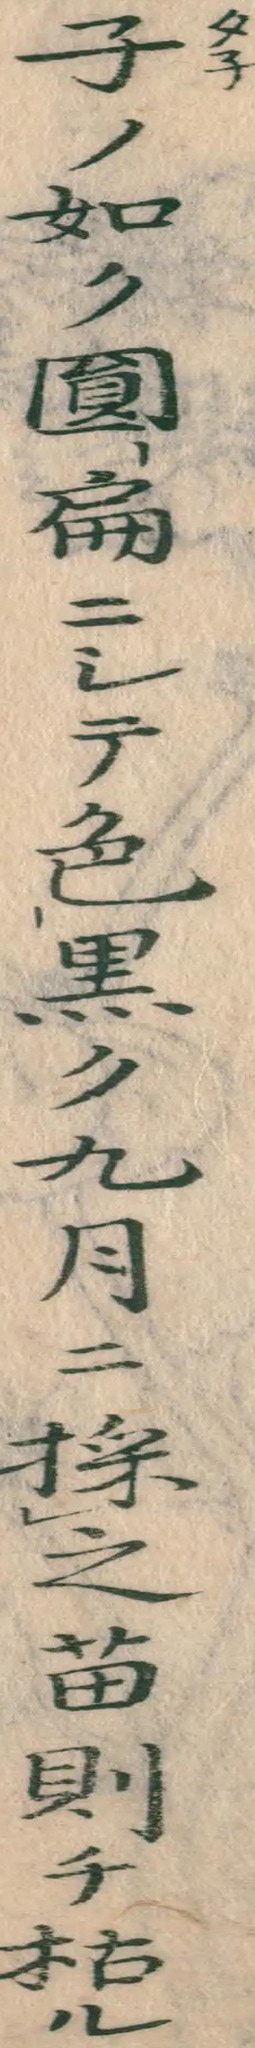子ノ如ク円-扁ニシテ色-黒ク九月ニ採之苗則チ枯ル
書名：花彙 草部4巻木部4巻. [1]
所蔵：国立国会図書館 National Diet Library, JAPAN
